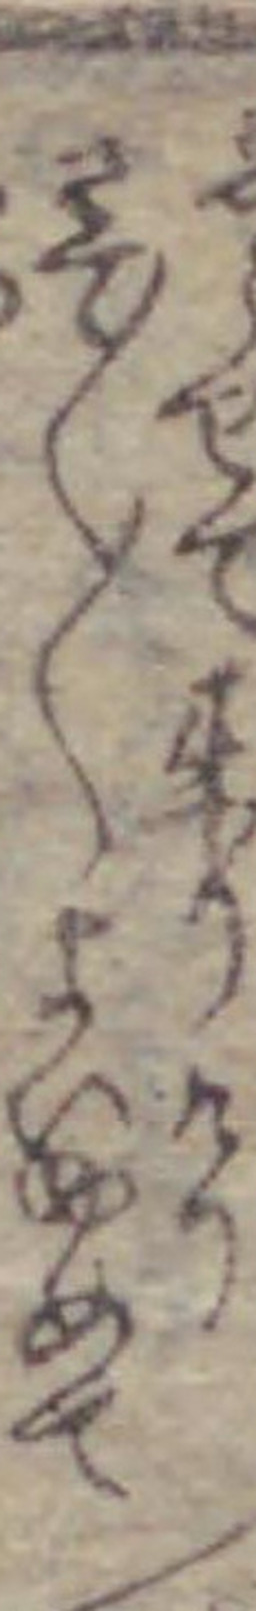さて〳〵〳〵よいゆめて
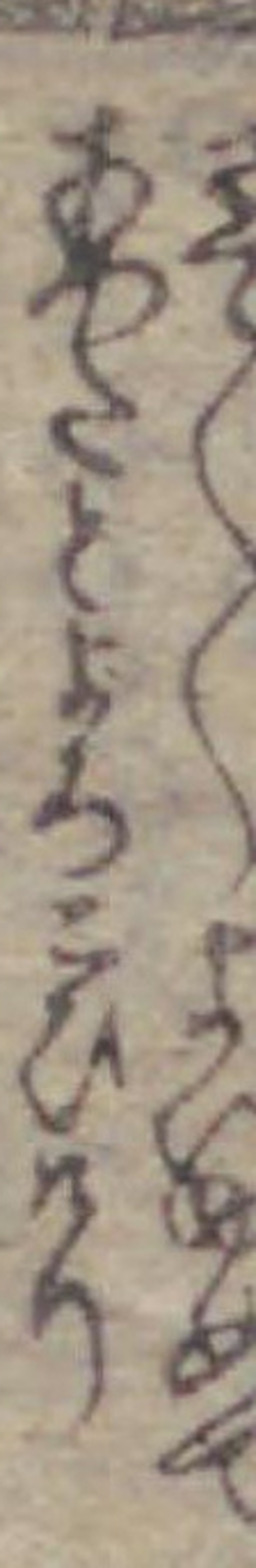あつたとよろこひけり

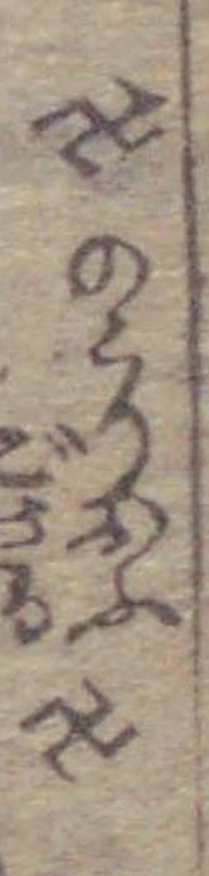のこりおふ
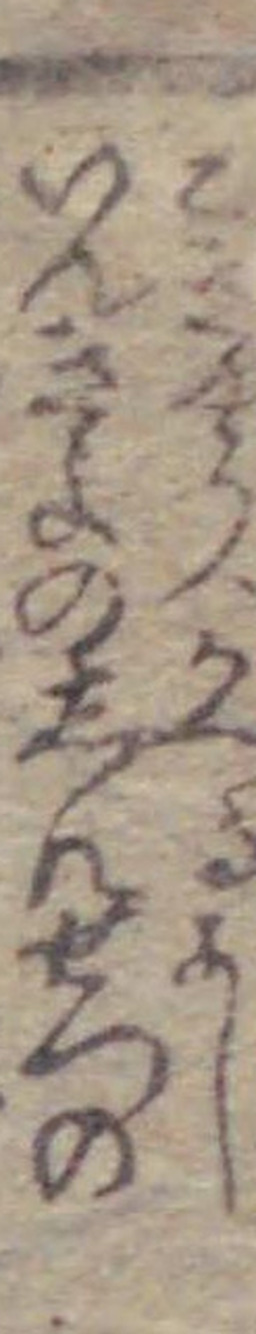いんきよのしんせつの
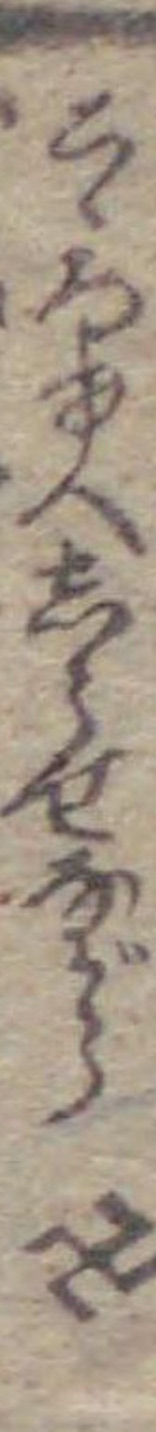こゝろゆへしらせながら
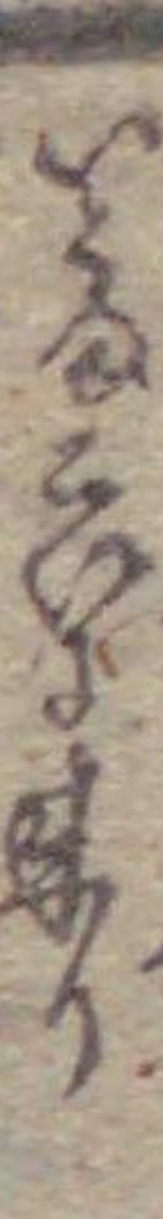いとまこいに来り
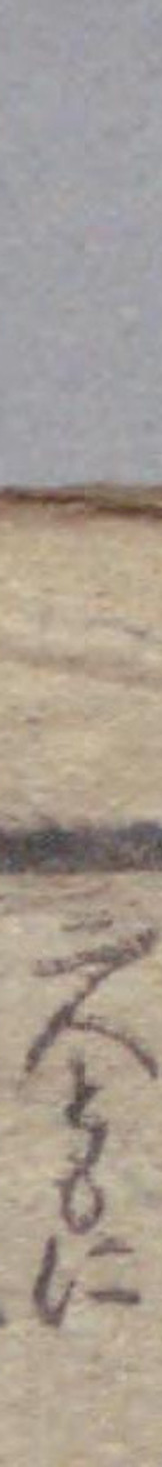二人ともに
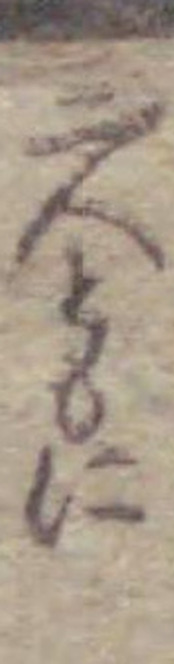二人ともに
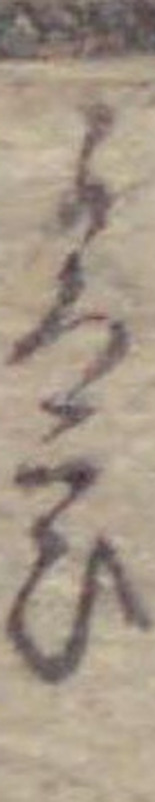よろこひ
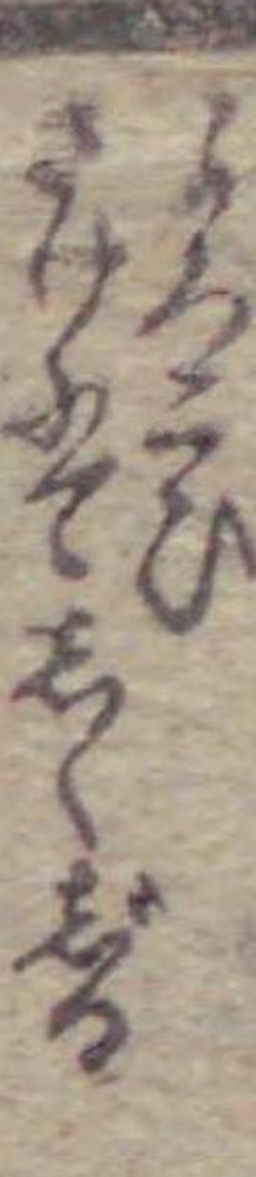さけにてしくじる
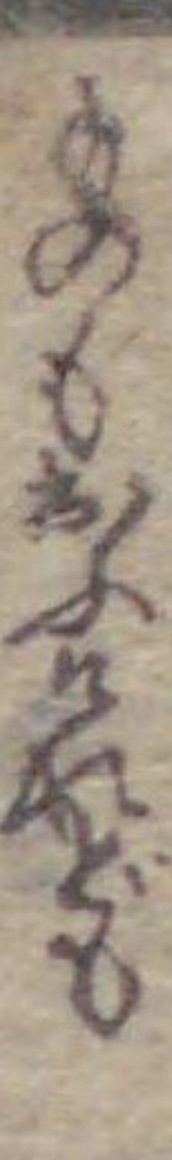ものもおふけれども
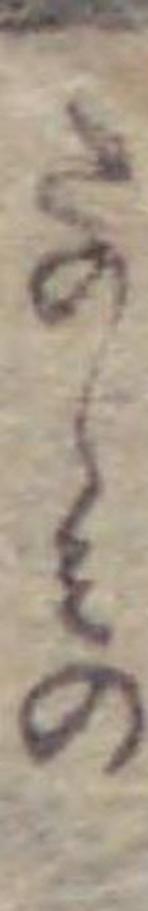たのしみの
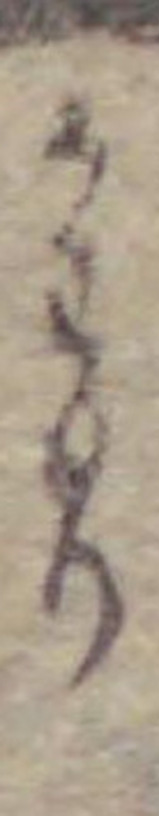うわもり
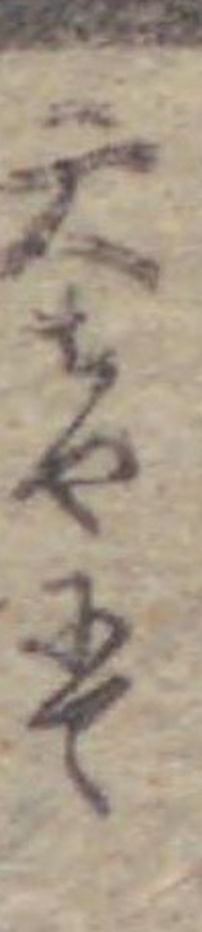二人ちやにて
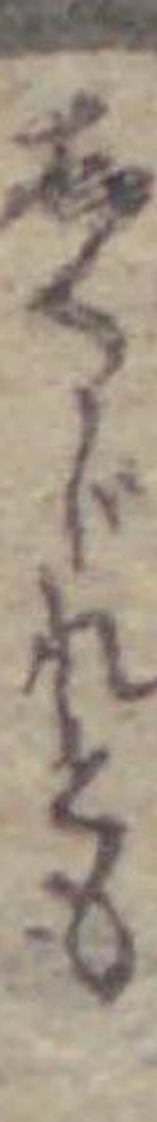しくじれとも
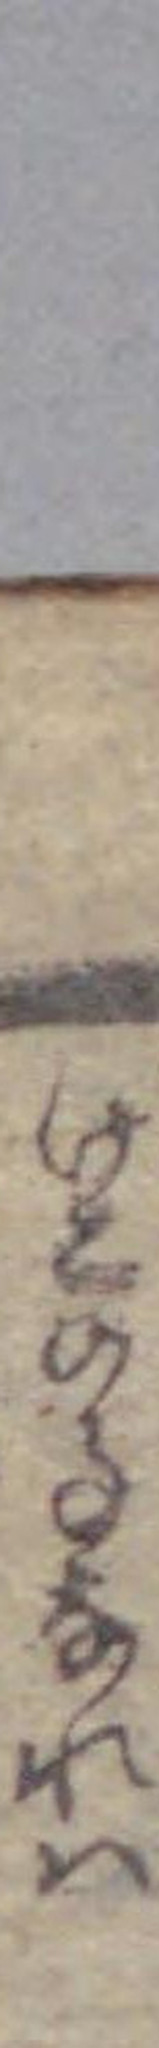けこの事なれは
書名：見通占 : 3巻
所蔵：国立国会図書館 National Diet Library, JAPAN
